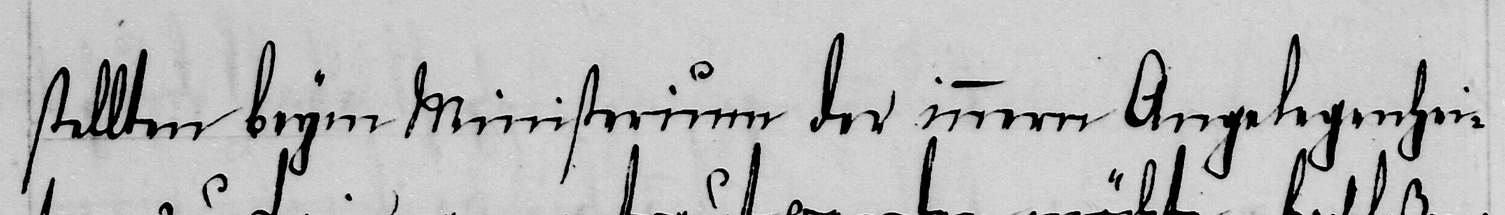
stellten beym Ministerium der innern Angelegenhei¬
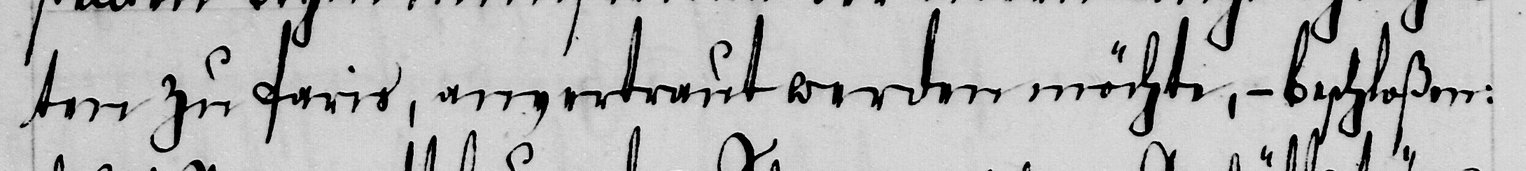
ten zu Paris, anvertraut werden möchte, – beschloßen:
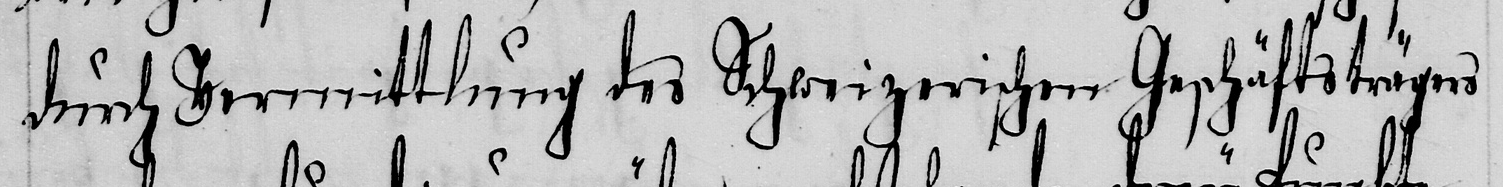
durch Vermittlung des Schweizerischen Geschäftsträge¬
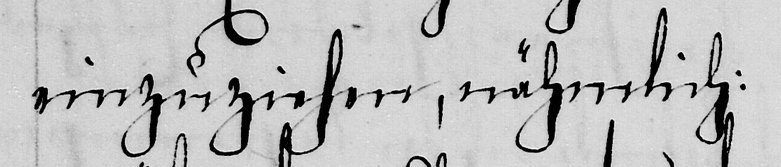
einzuziehen, nähmlich:
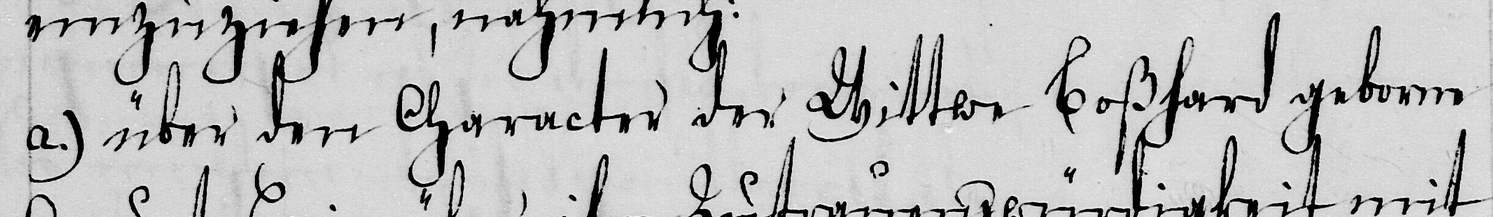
a.) über den Character der Wittwe Boßhard geborene
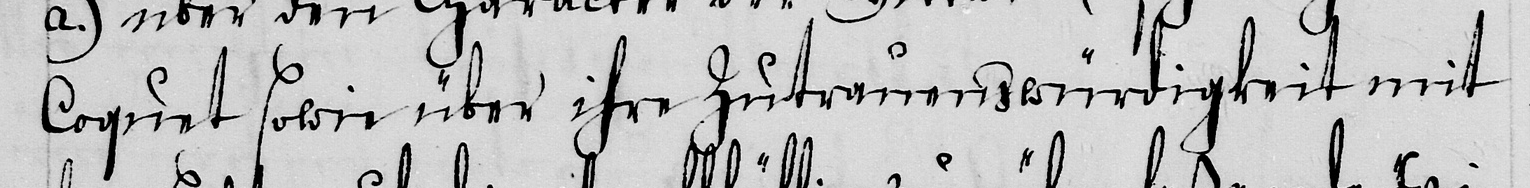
Coquet sowie über ihre Zutrauenswürdigkeit mit
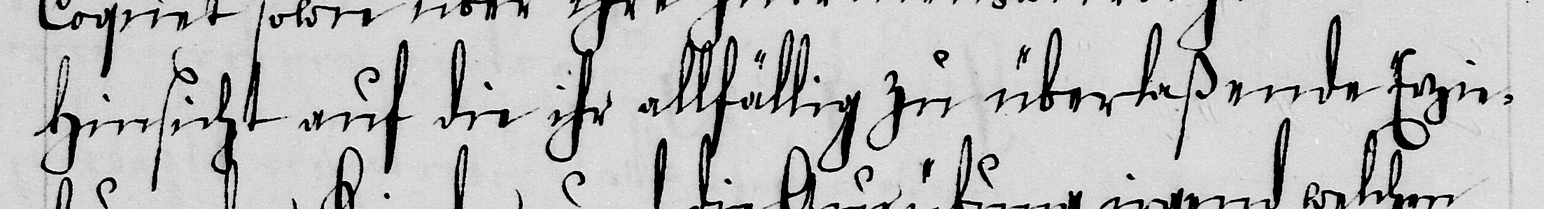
Hinsicht auf die ihr allfällig zu überlaßende Erzie¬
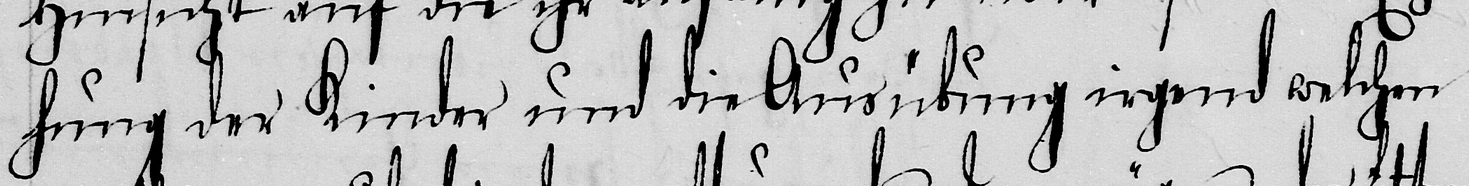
hung der Kinder und Ausübung irgend welchen
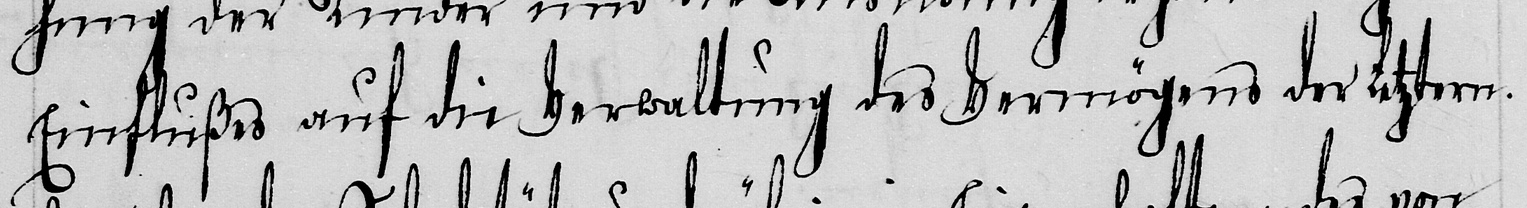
Einflußes auf die Verwaltung des Vermögens der Letzter¬
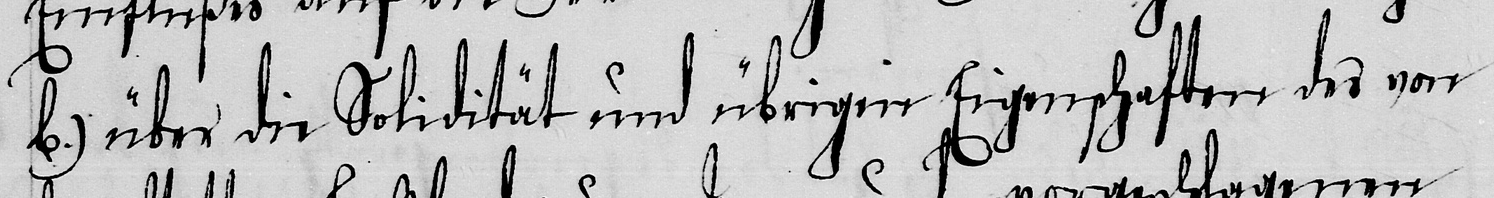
b.) über die Solidarität und übrigen Eigenschaften des von
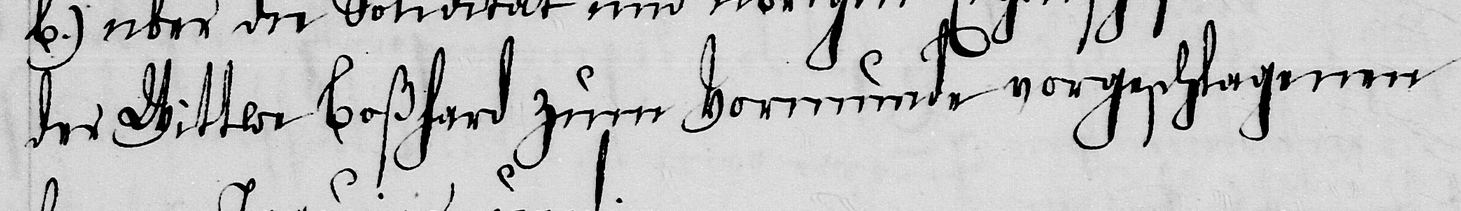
der Wittwe Boßhard zum Vormunde vorgeschlagenen
